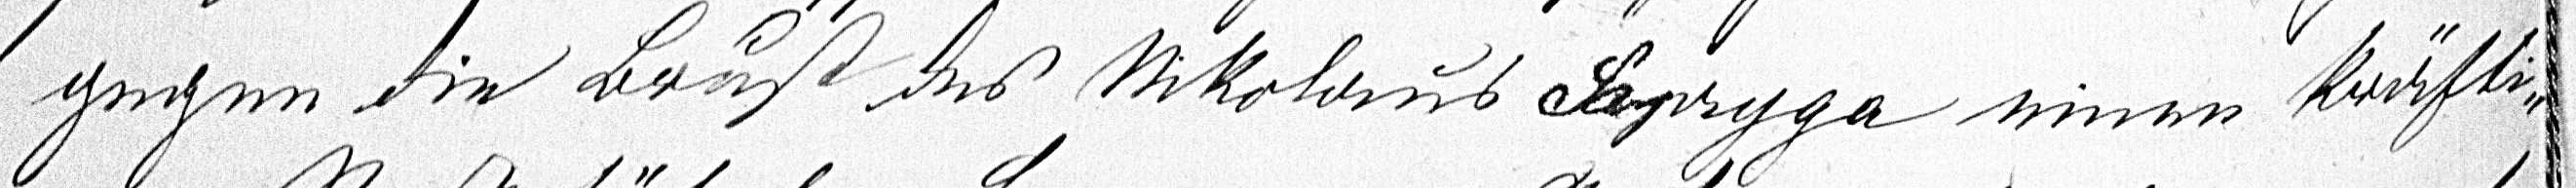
gegen die Brust des Nikolaus Sapryga einen kräfti¬
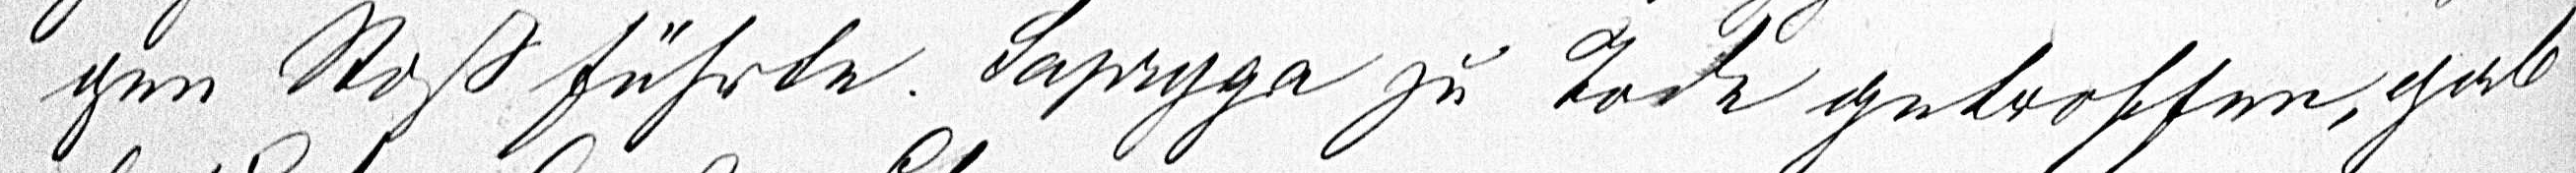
gen Stoß führte. Sapryga zu Tode getroffen, gab
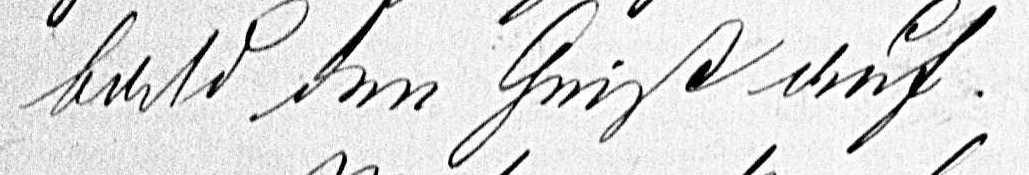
bald den Geist auf.
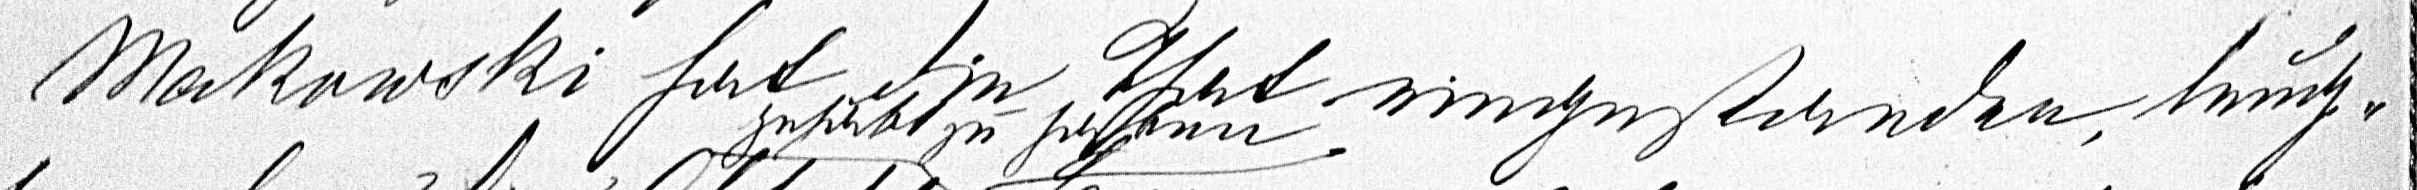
Makowski hat die That eingestanden, leg¬
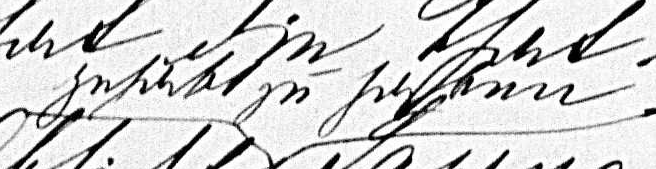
gehabt zu haben
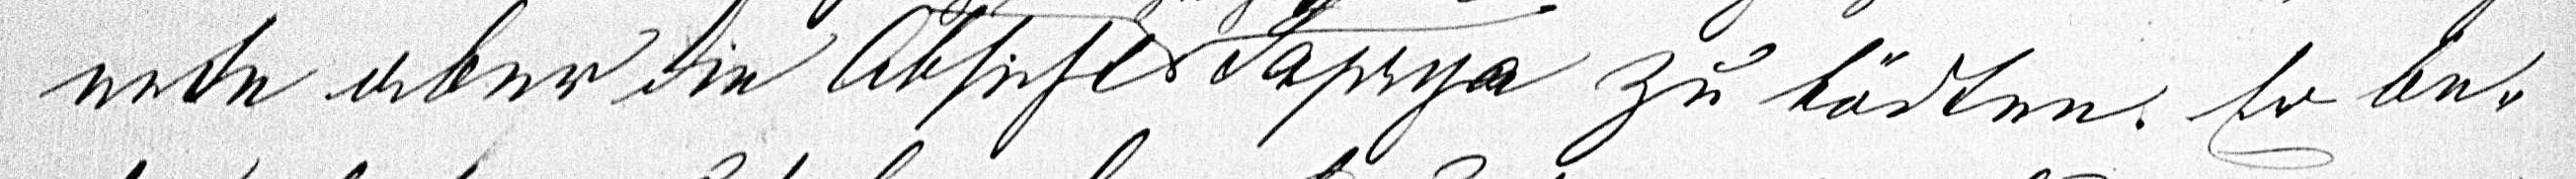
nete aber die Absicht Sapryga zu tödten. Er be¬
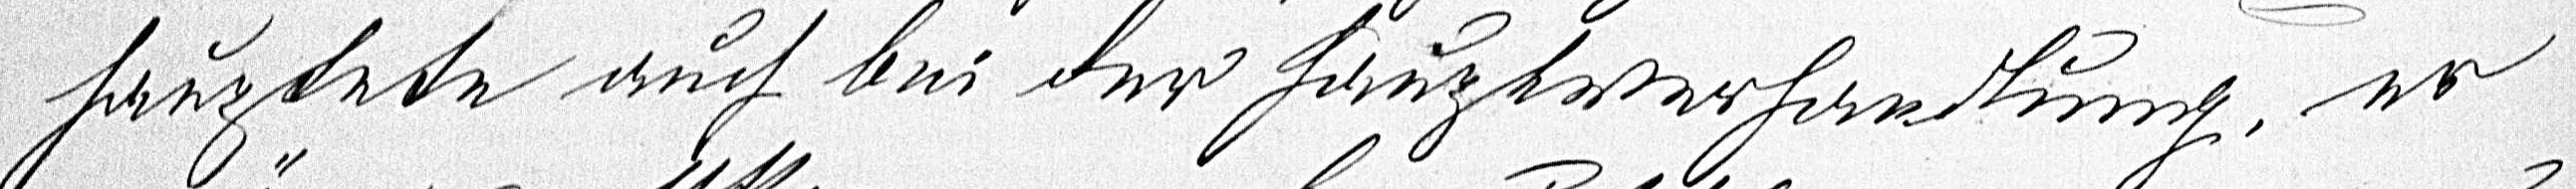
hauptete auch bei der Hauptverhandlung, er
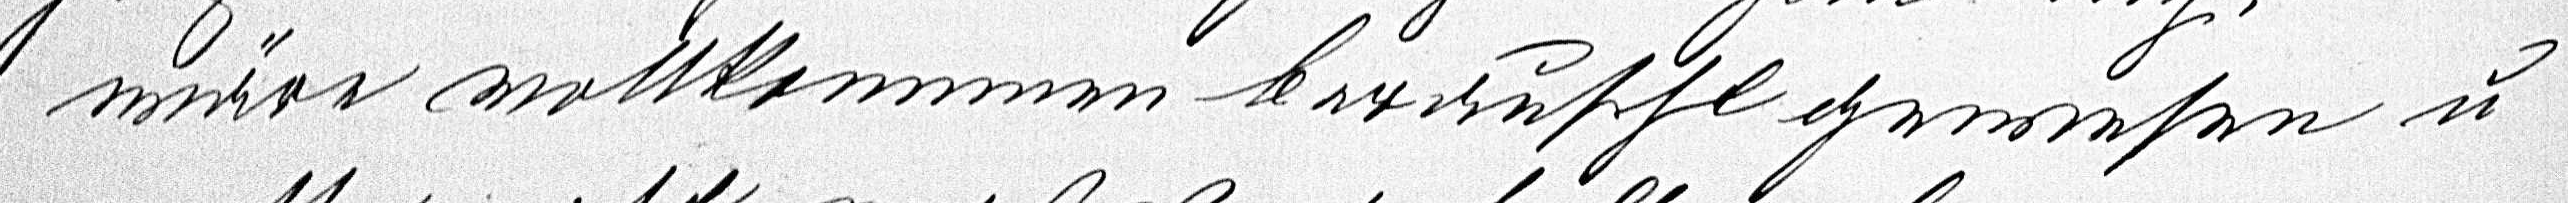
wäre vollkommen berauscht gewesen u
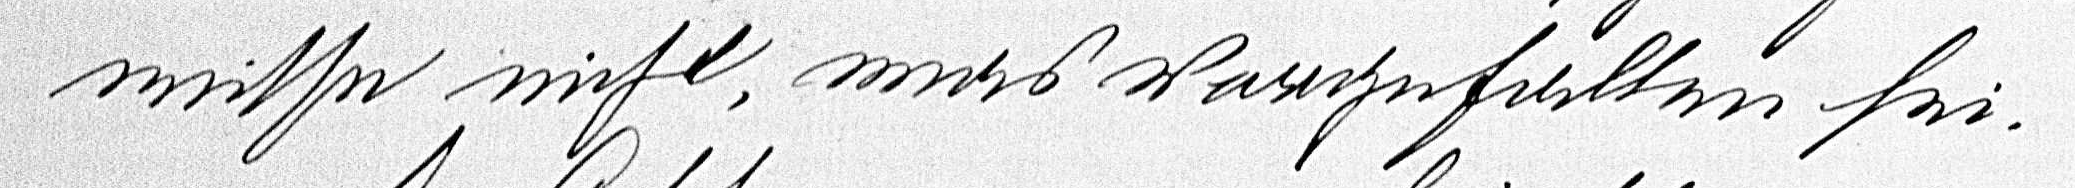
wisse nicht, was vorgefalten sei.
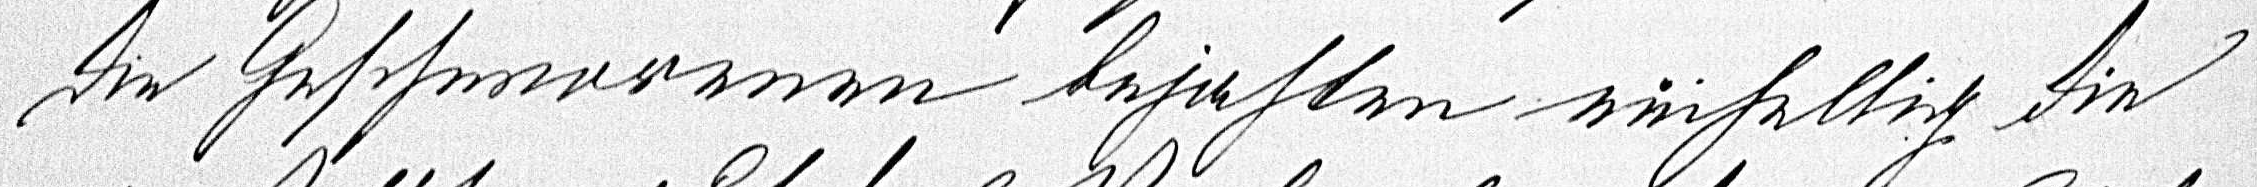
Die Geschworenen bejahten einhellig die
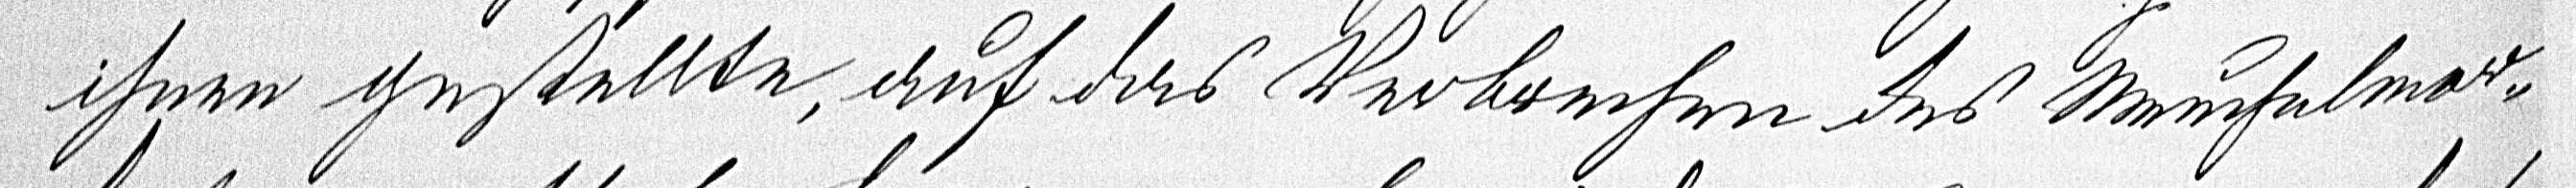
ihnen gestellte, auf das Verbrechen des Meuchelmor¬
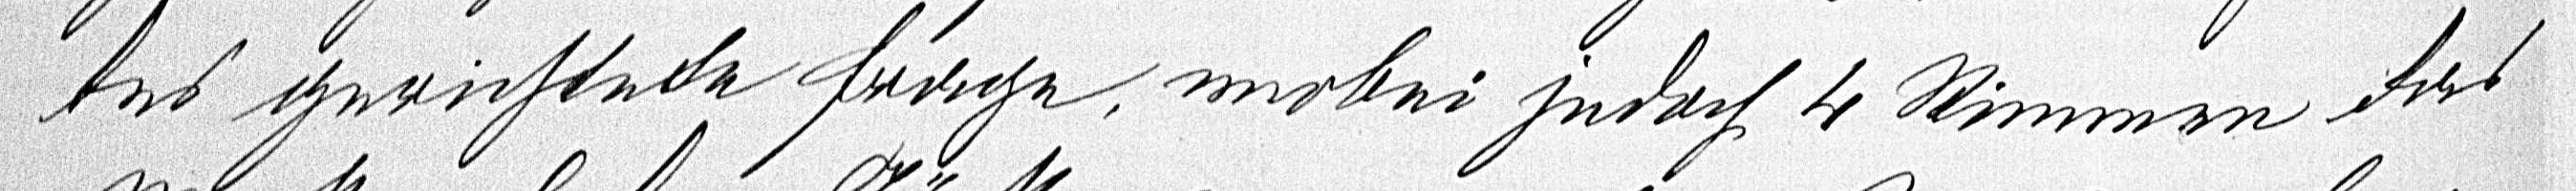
des gerichtete Frage, wobei jedoch 4 Stimmen das
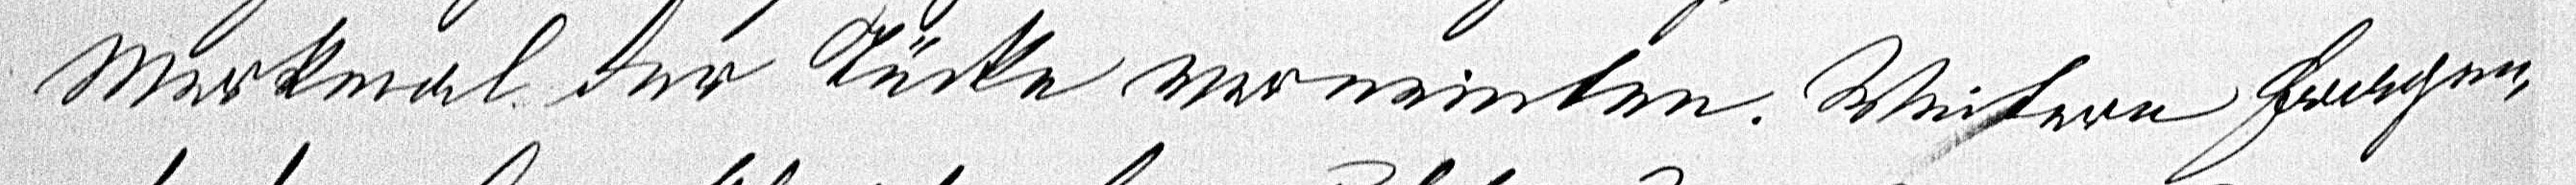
Merkmal der Tücke verneinten. Weitere Fragen,
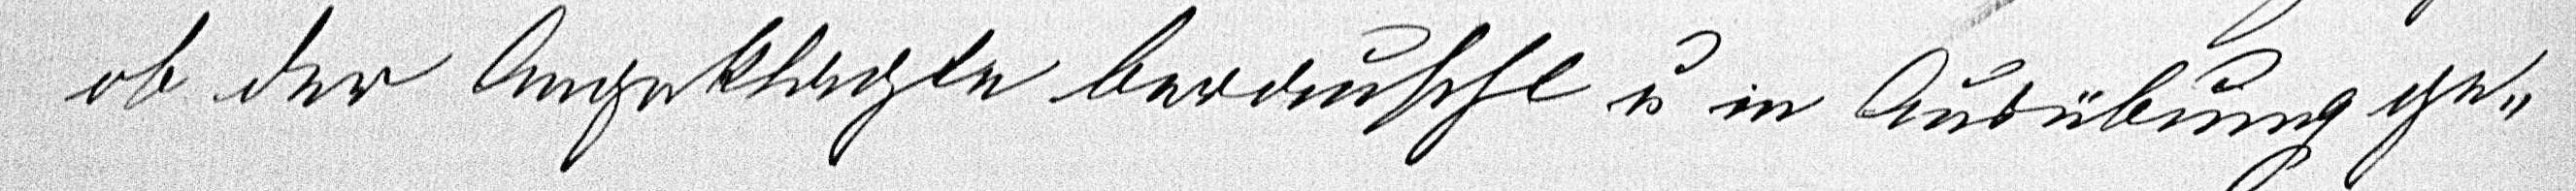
ob der Angeklagte berauscht u in Ausübung ge¬
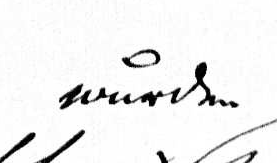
wurde
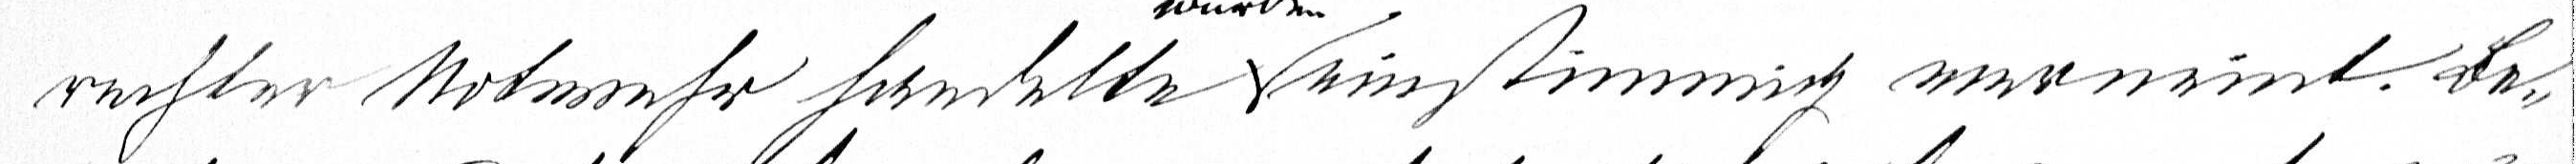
rechter Notwehr handelte einstimmig verneint. Be¬
